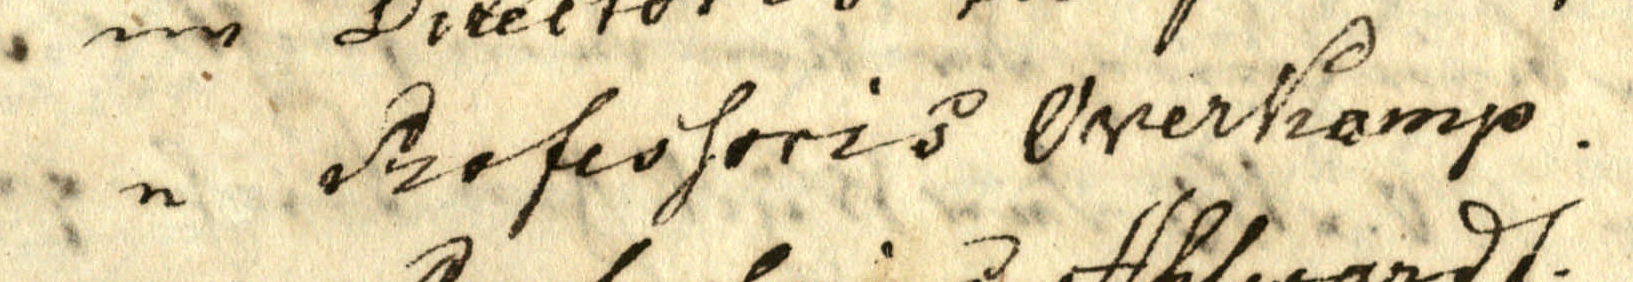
Professoris Overkramp
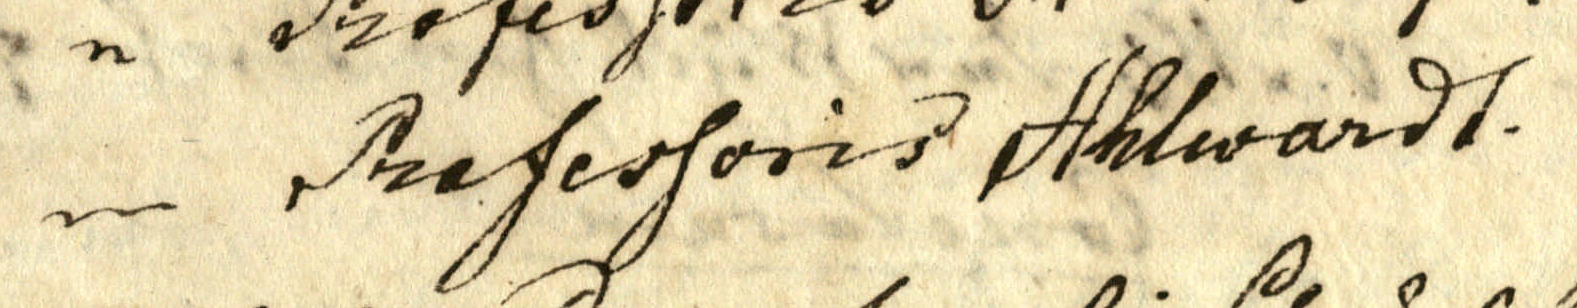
Professoris Ahlwardt.
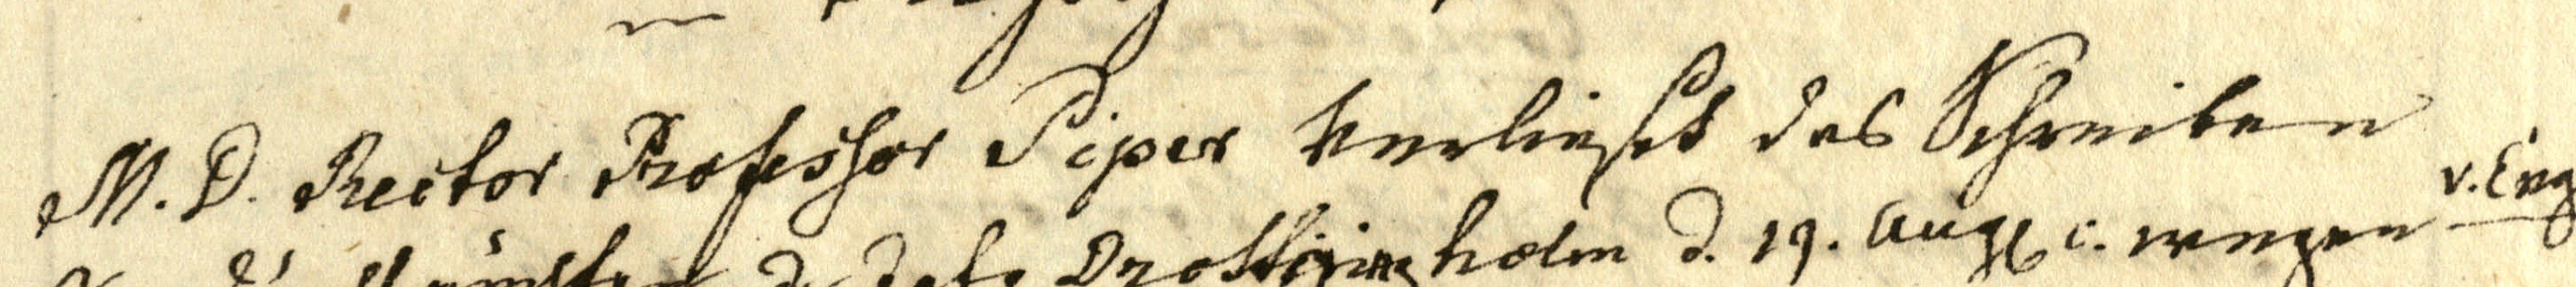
.M. D. Rector Professor D per verlieset das Schreiben
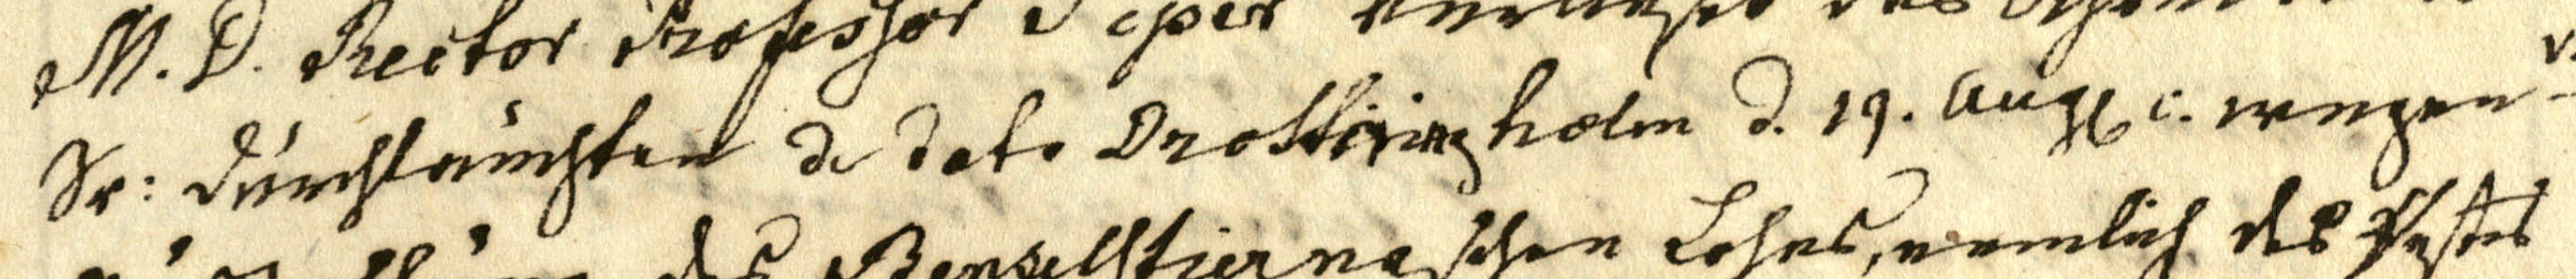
Sr Durchlaucht 2. dato Drottigifiolm die 19. lange. . wegen
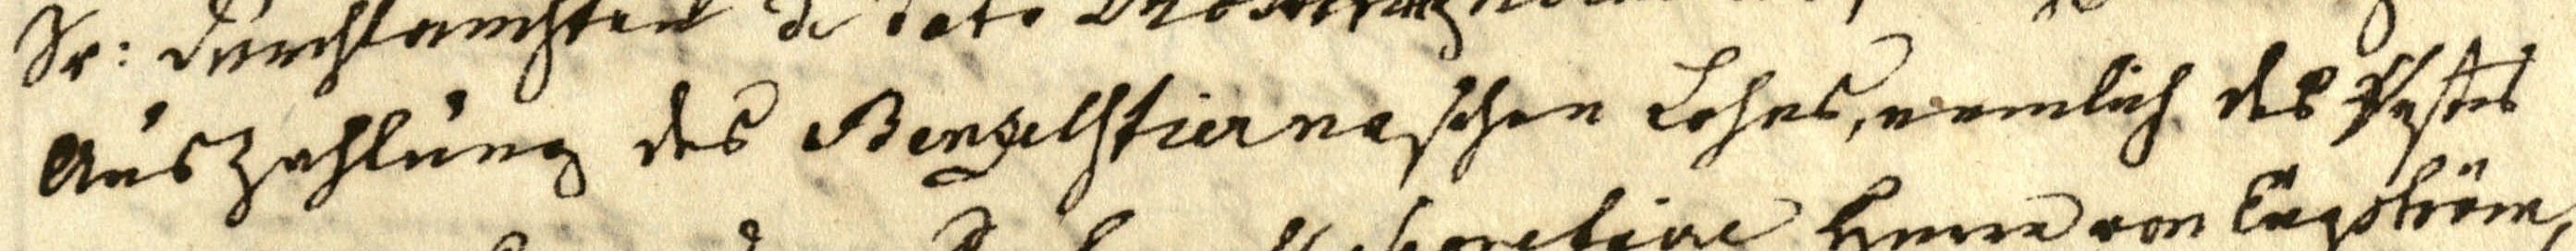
Auszahlung des Benzelstirnaschen Lohns, nemlich des Rostock
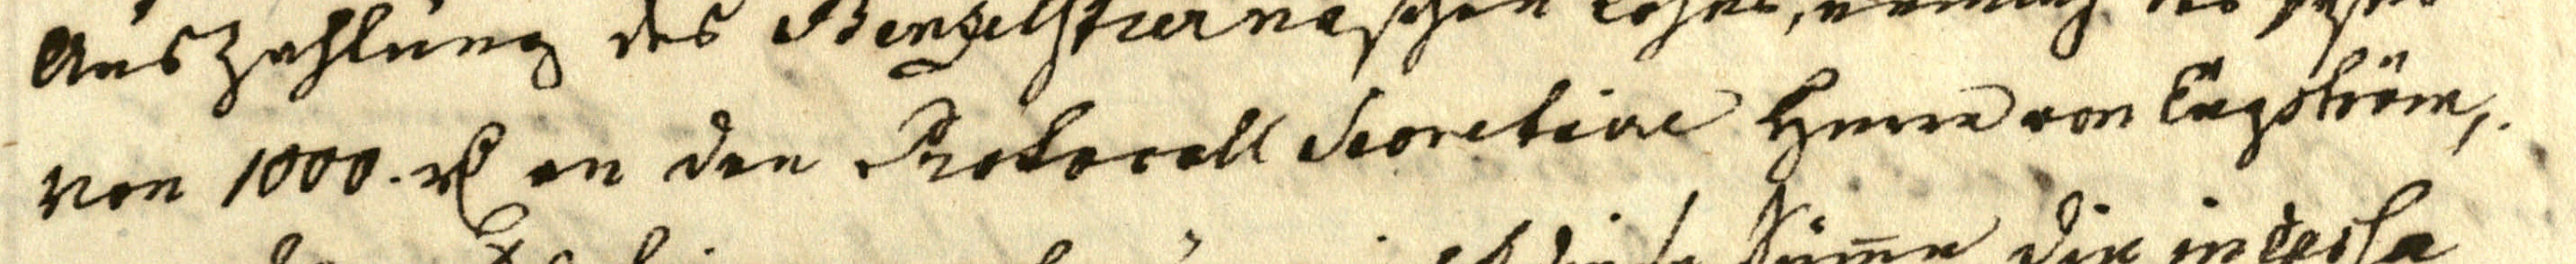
von 1000 rt in den Protocoll Secretaire Herrn von Cagström
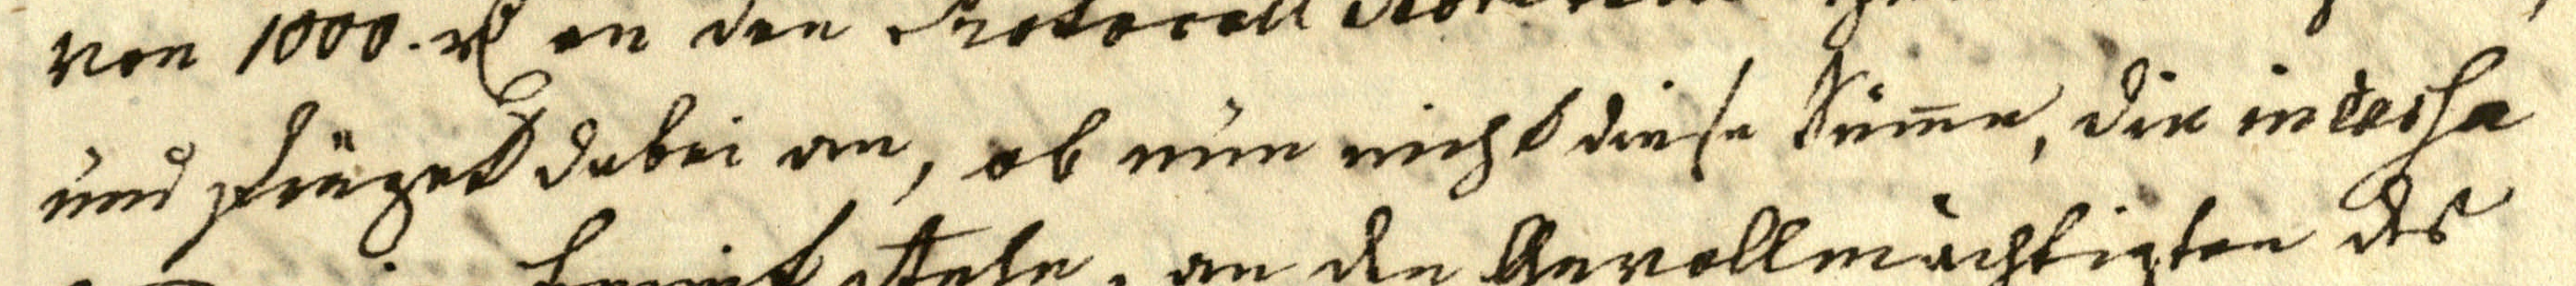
und fräget dabei an, ob nun nicht diese Stimme, die ndesta
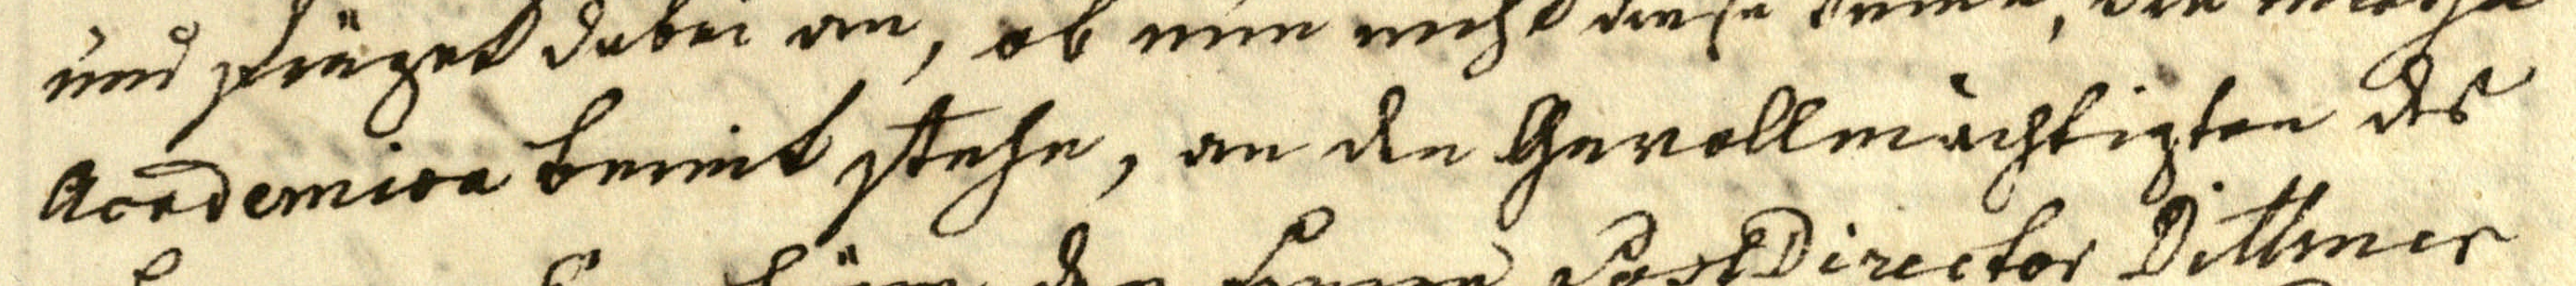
Academica bei stehe, an den Gevollmächtigten da
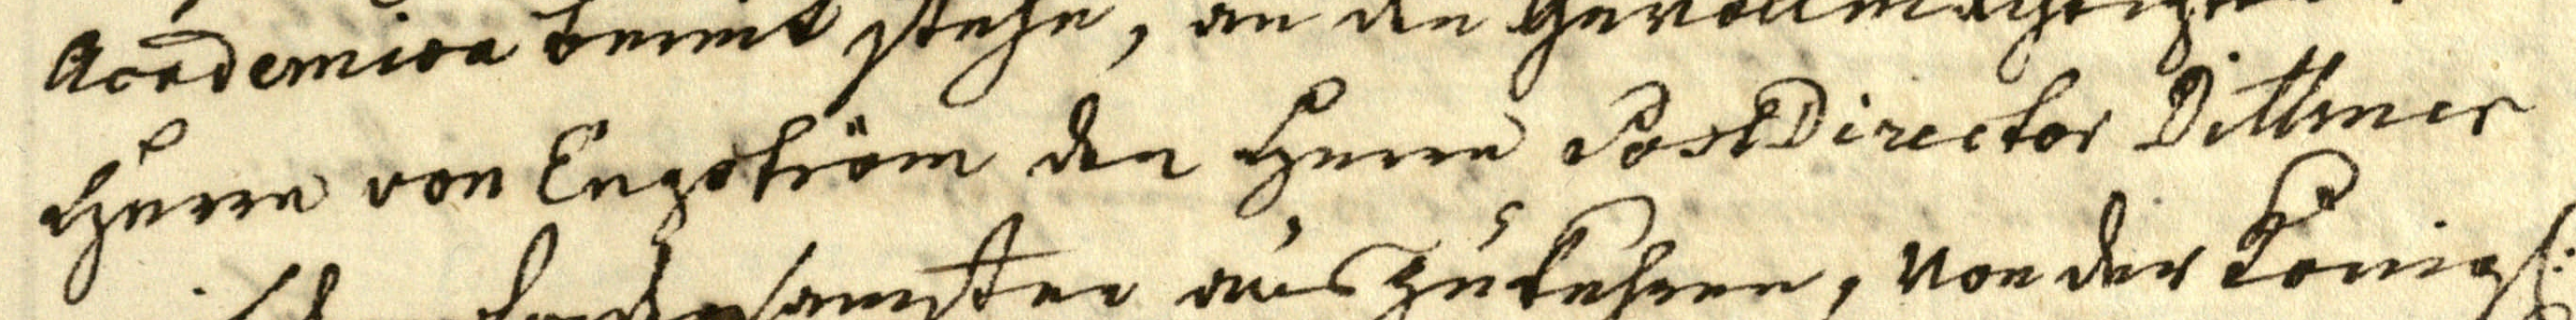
Herrn von Engetröm den Herrn Postdirector Ditlmer
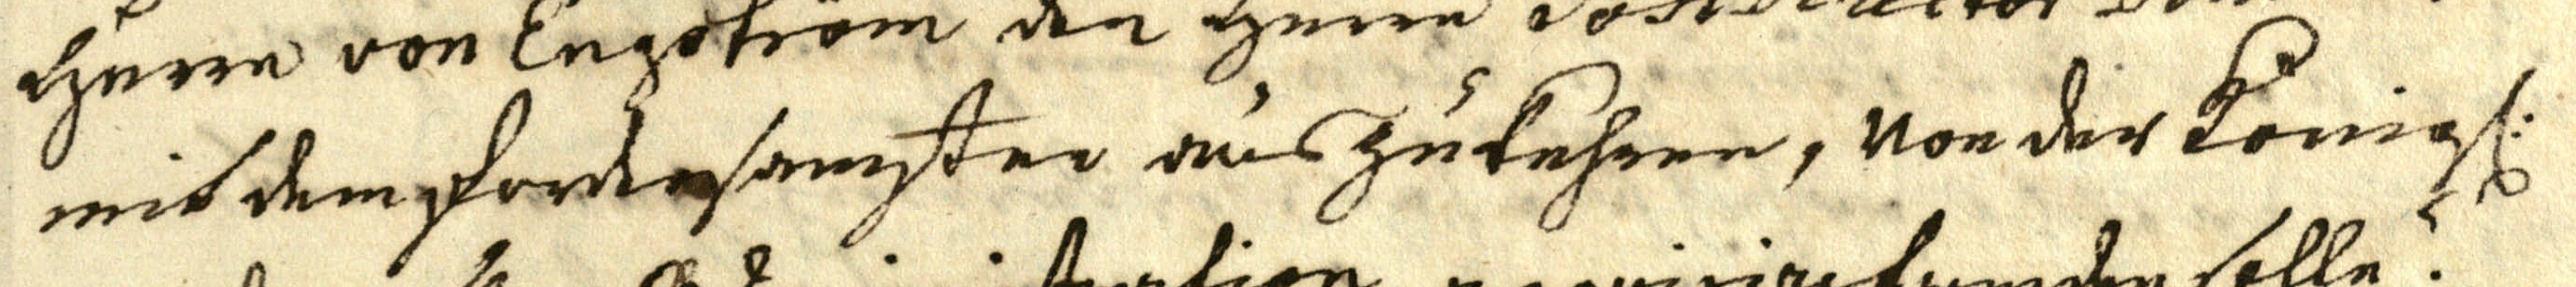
mit dem fordersamsten aus zukehren, von der Königl.
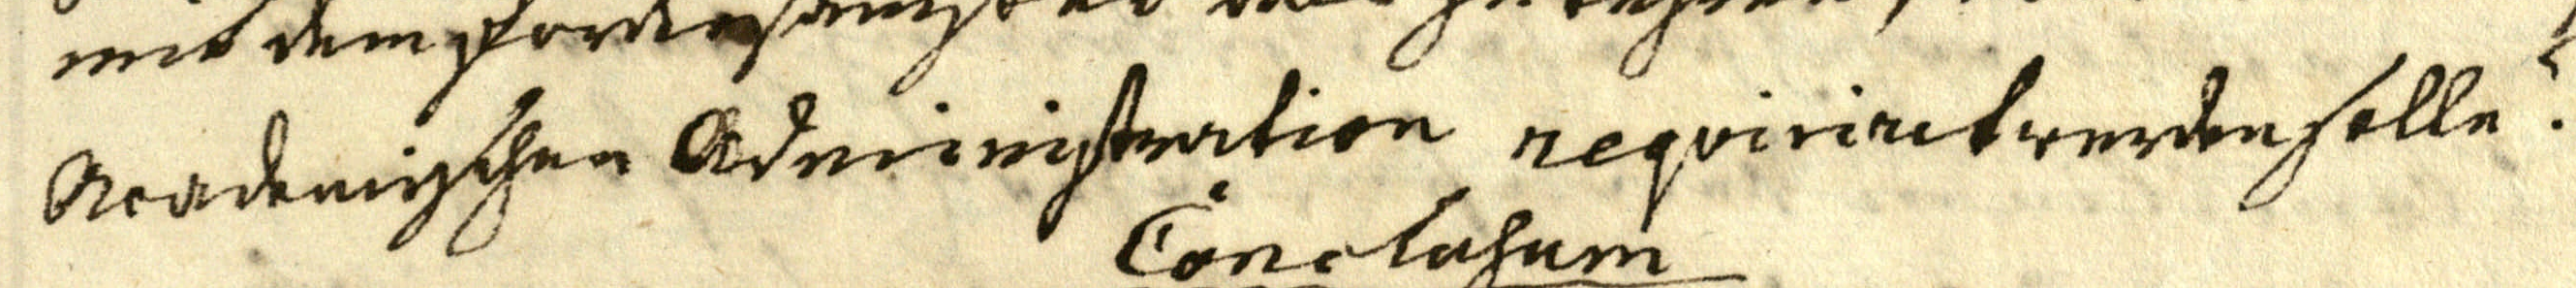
Academischen Administration requiriret werden solle?
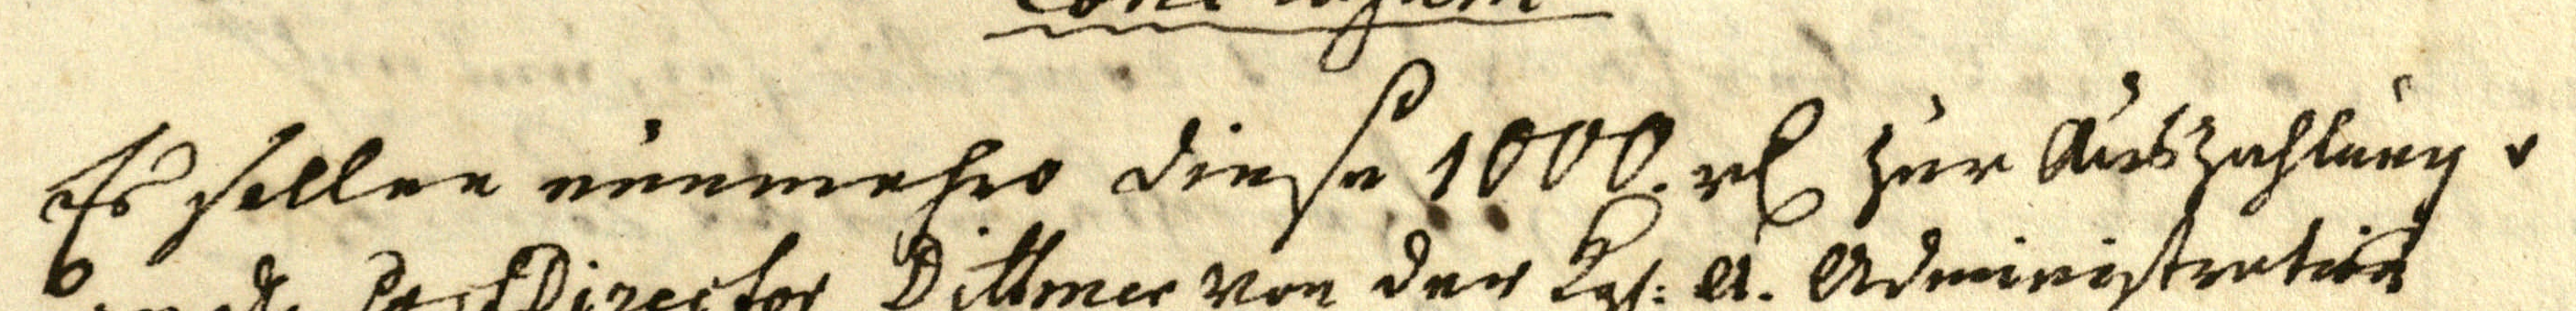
Es sollen nunmehro diese 1000. rt zur Auszahlung
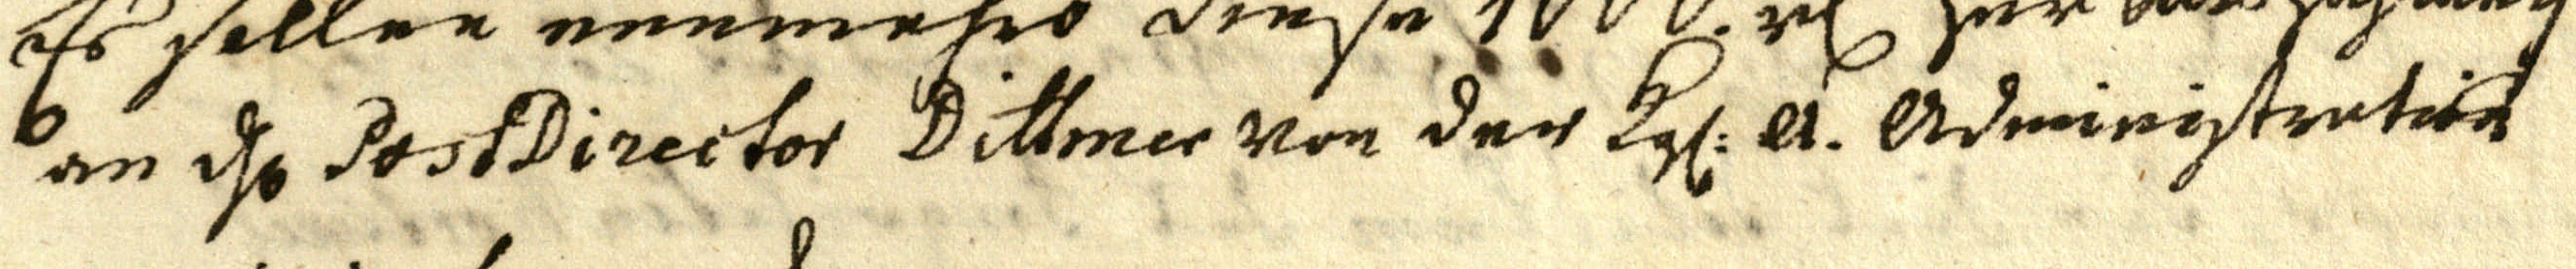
an dh PostDirector Dittmer von der Kgl. A. Administration
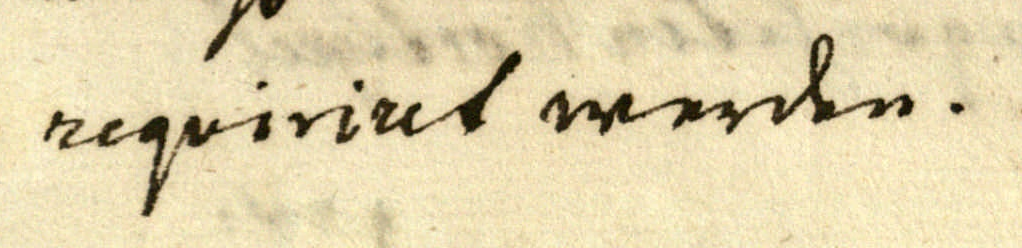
requiriret werden.
